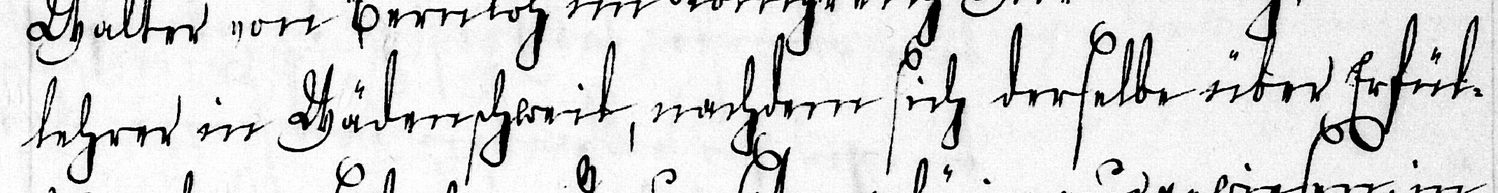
lehrer in Wädenschweil, nachdem sich derselbe über Erfül¬
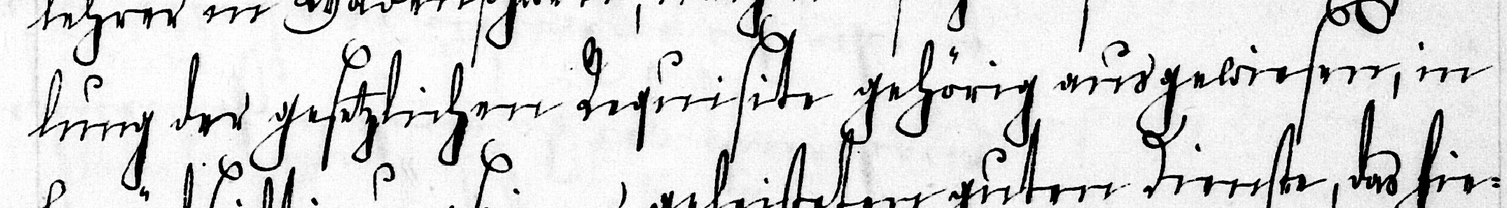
lung der gesetzlichen Requisite gehörig ausgewiesen, in
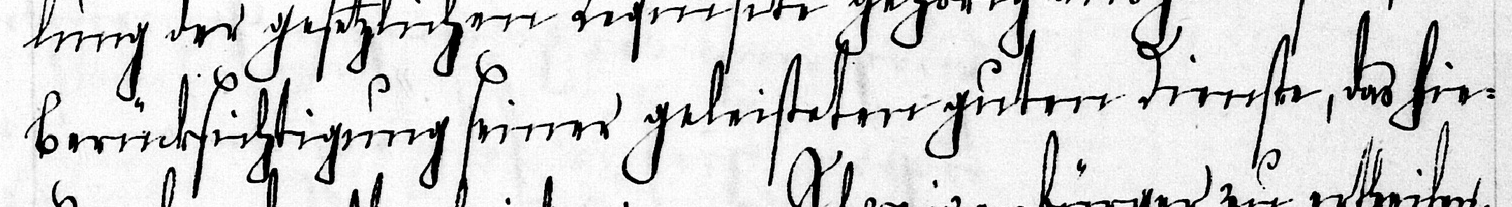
Berücksichtigung seiner geleisteten guten Dienste, das hie¬
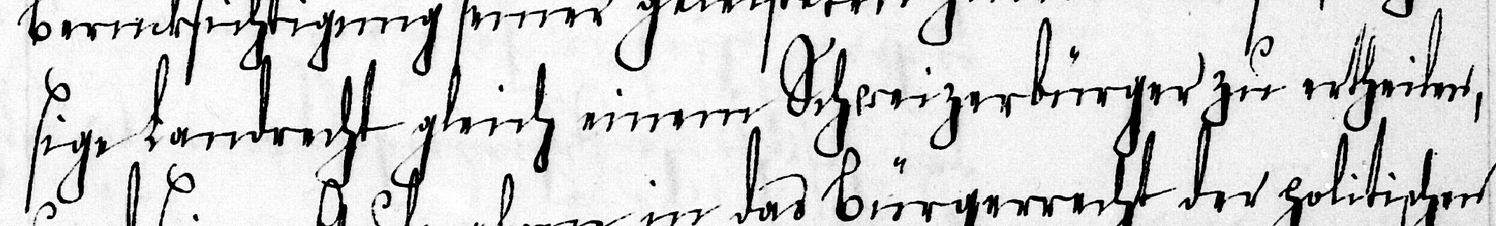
sige Landrecht gleich einem Schweizerbürger zu ertheilen,
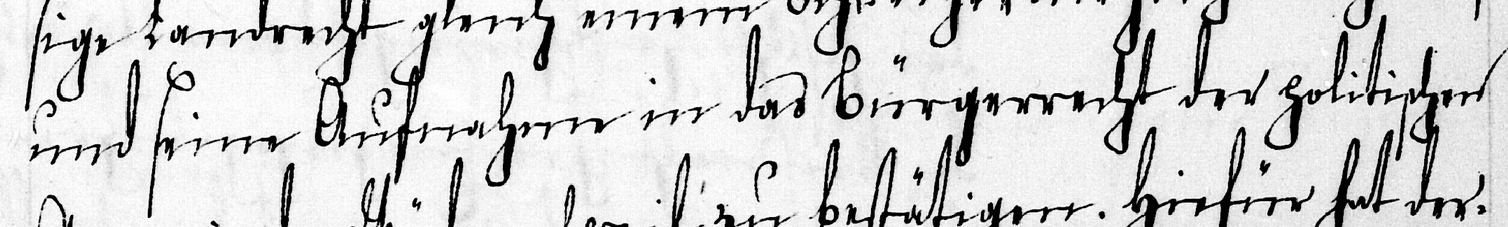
und seine Aufnahme in das Bürgerrecht der politischen
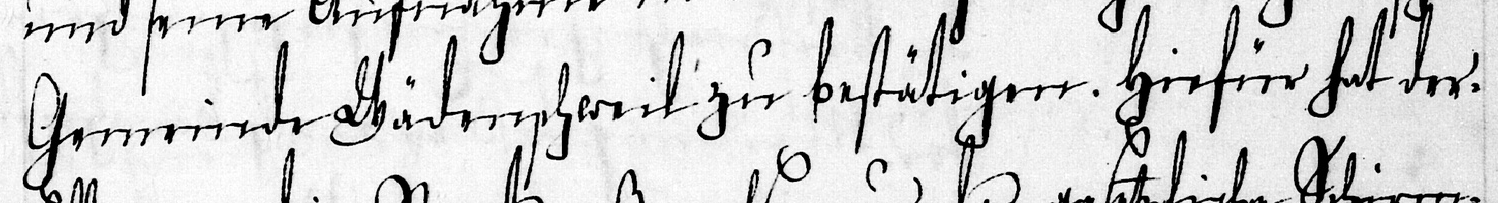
Gemeinde Wädenschweil zu bestätigen. Hiefür hat der¬
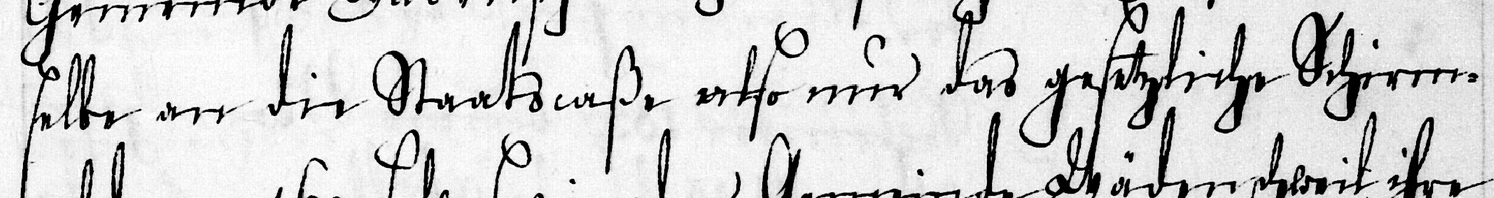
selbe an die Staatscaße nur das gesetzliche Schirmg¬
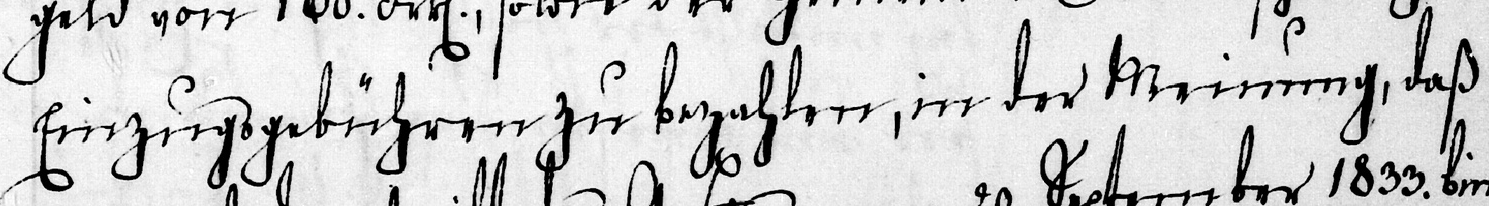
Einzugsgebühren zu bezahlen, in der Meinung, daß
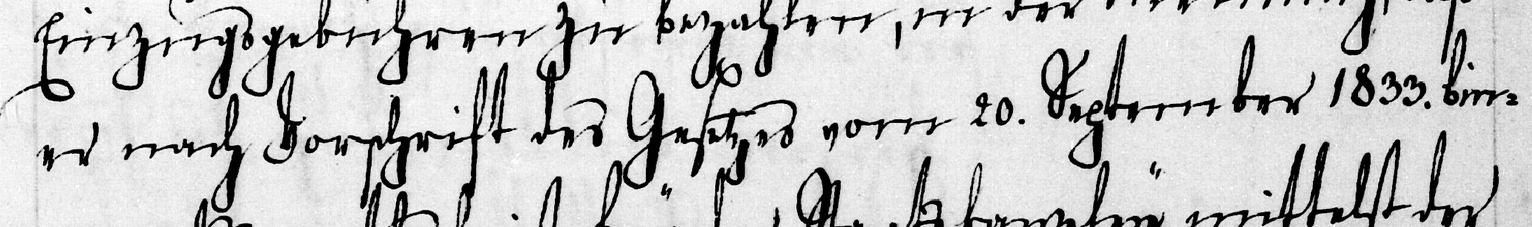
er nach Vorschrift des Gesetzes vom 20. September 1833. bin¬
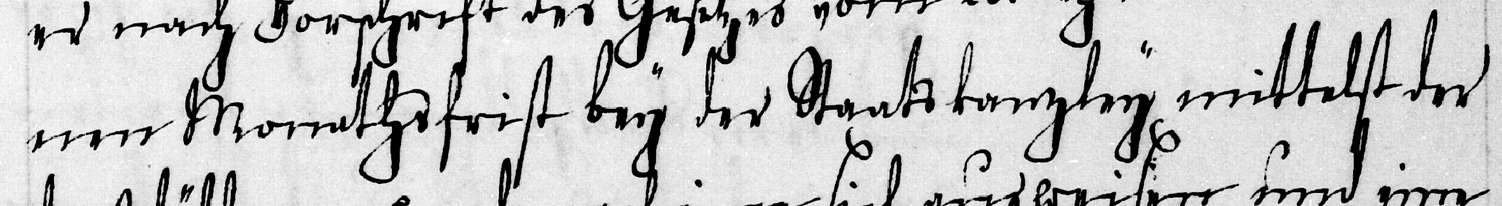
nen Monathsfrist bey der Staatskanzley mittelst der
